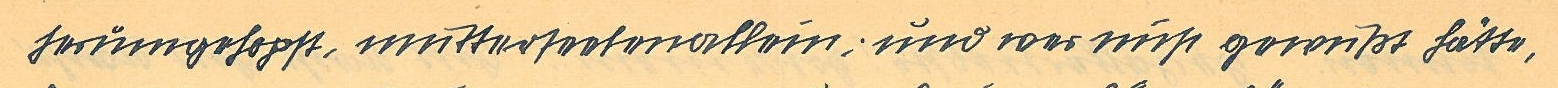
herumgehopst, mutterseelenallein; und wer nicht gewußt hätte,
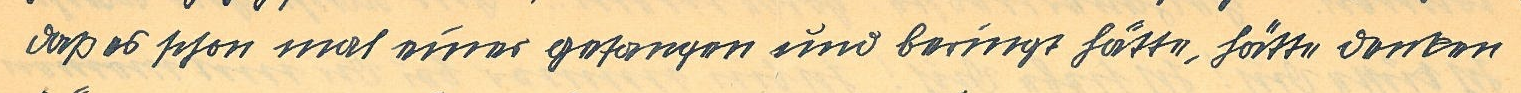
daß es schon mal einer gefangen und beringt hätte, hätte denken
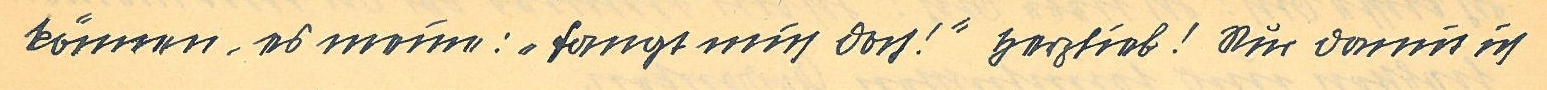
können, es meine: „Fangt mich doch!” Herzlieb! Nur damit ich
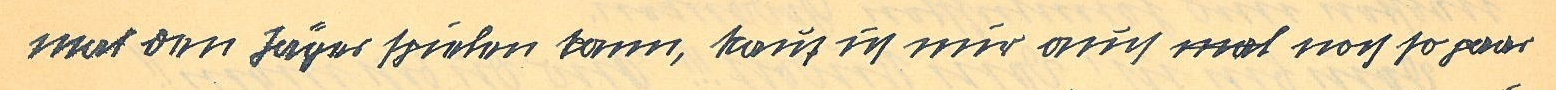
mal den Jäger spielen kann, kauf ich mir auch mal noch so paar
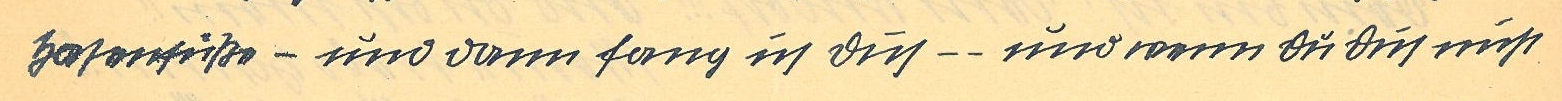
Hasenfüße – und dann fang ich Dich – – und wenn Du Dich nicht
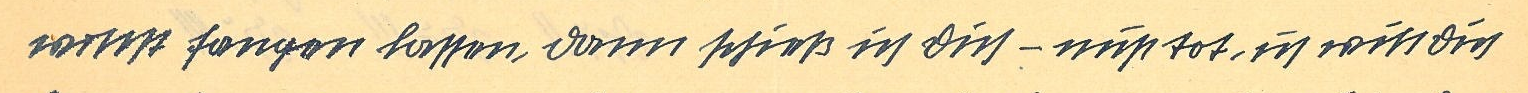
willst fangen lassen, dann schieß ich Dich – nicht tot, ich will Dich
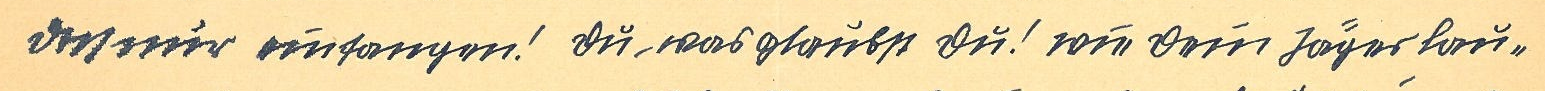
ja nur einfangen! Du, was glaubst Du! wie Dein Jäger lau¬
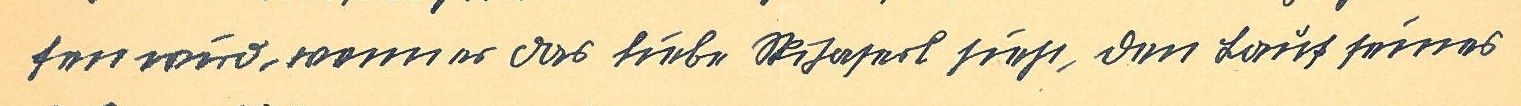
fen wird, wenn er das liebe Skihaserl sieht, den Lauf seines
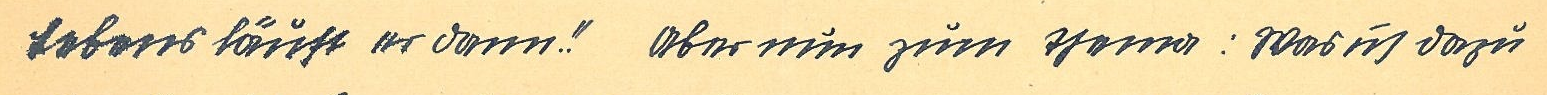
Lebens läuft er dann!! Aber nun zum Thema: Was ich dazu
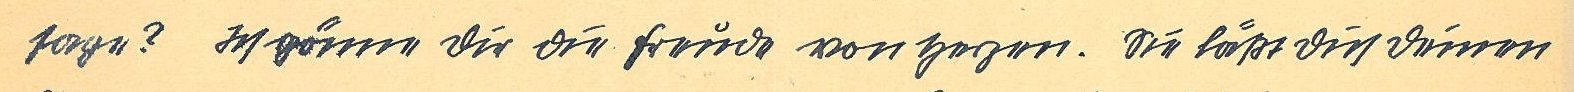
sage? Ich gönne Dir die Freude von Herzen. Sie läßt Dich Deinen
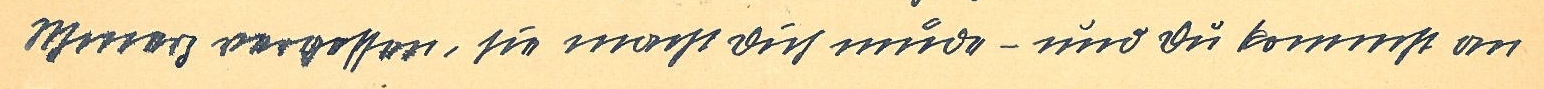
Schmerz vergessen, sie macht Dich müde – und Du kommst an
